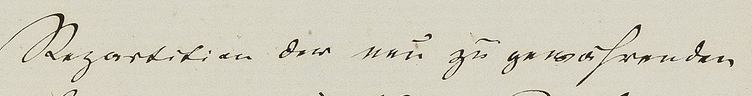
Repartition der neu zu gewährenden
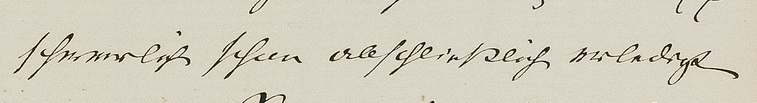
schwerlich schon abschließlich erledigt
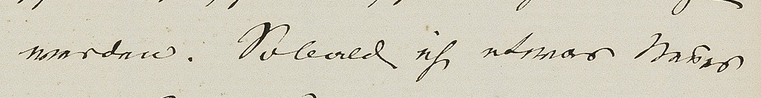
werden. Sobald ich etwas Neues
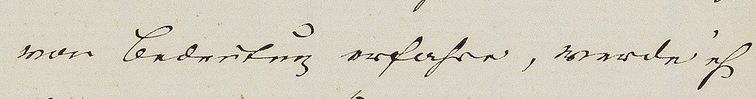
von Bedeutung erfahre, werde ich
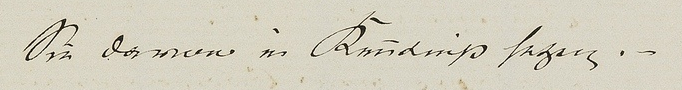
Sie davon in Kenntniß setzen. –
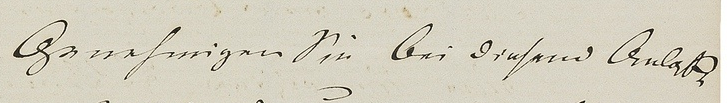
Genehmigen Sie bei diesem Anlaße
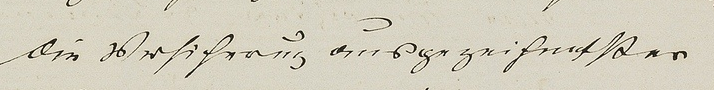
die Versicherung ausgezeichnetster
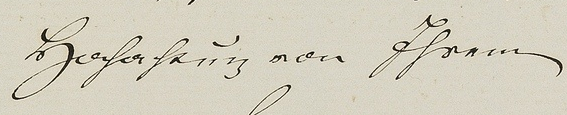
Hochachtung von Ihrem
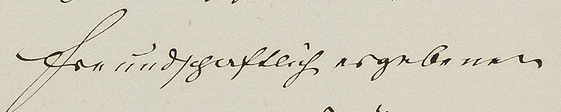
freundschaftlich ergebenen
